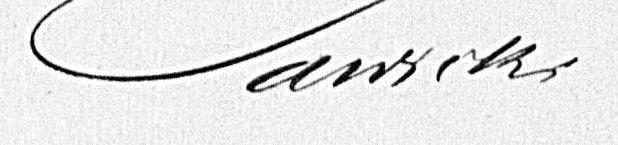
Sawicki
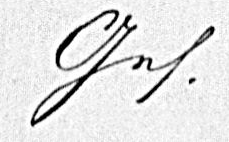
Ges.
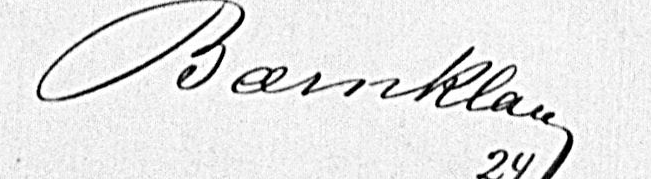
Bamklau
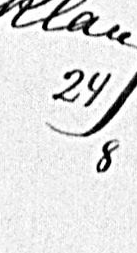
24/8
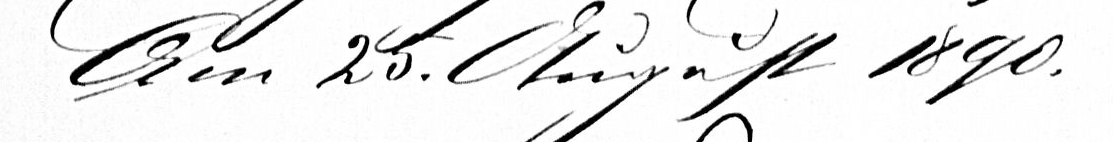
Am 25. August 1890.
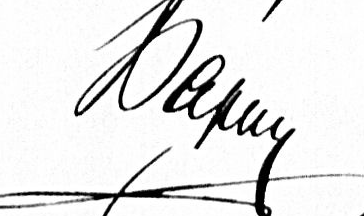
xx
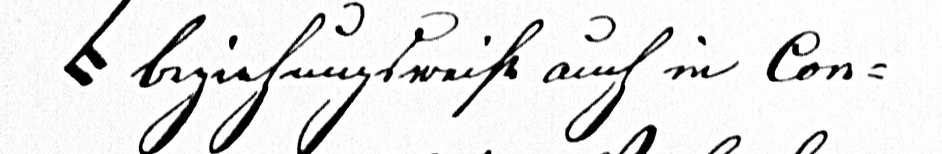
beziehungsweise auch in Con¬
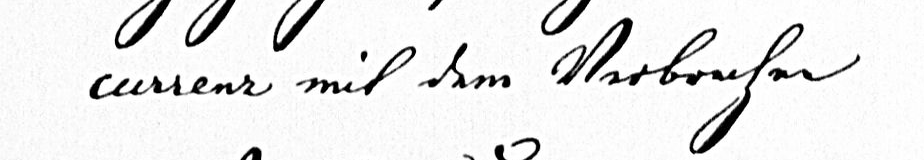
currenz mit dem Verbrechen
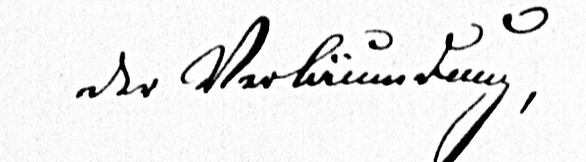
der Verläumdung,
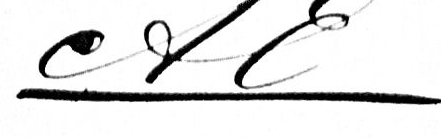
AE
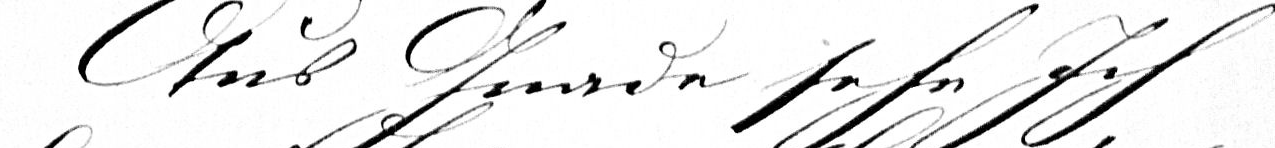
Aus Gnade sehe Ich
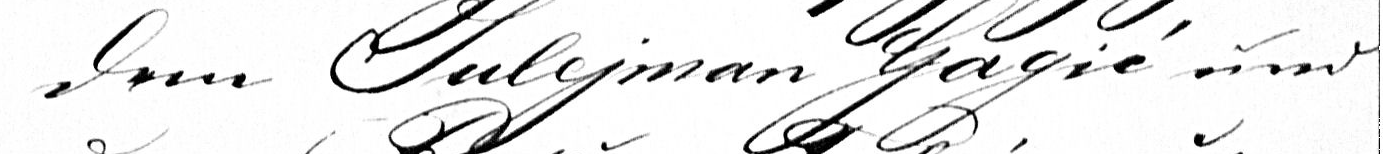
dem Sulejman Gagić und
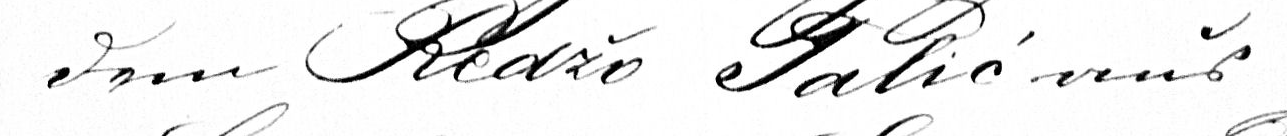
dem Redžo Galić aus
